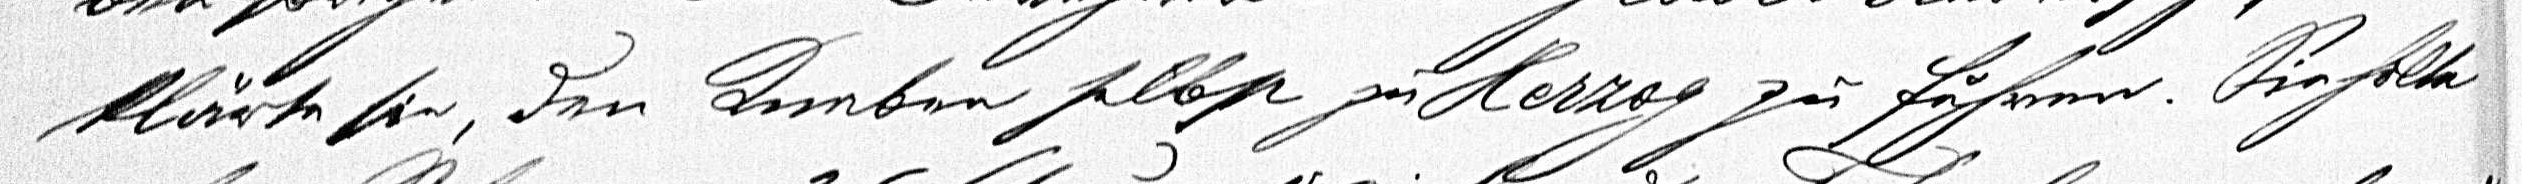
klärte sie, den Knaben selbst zu Herzog zu führen. Sie holte
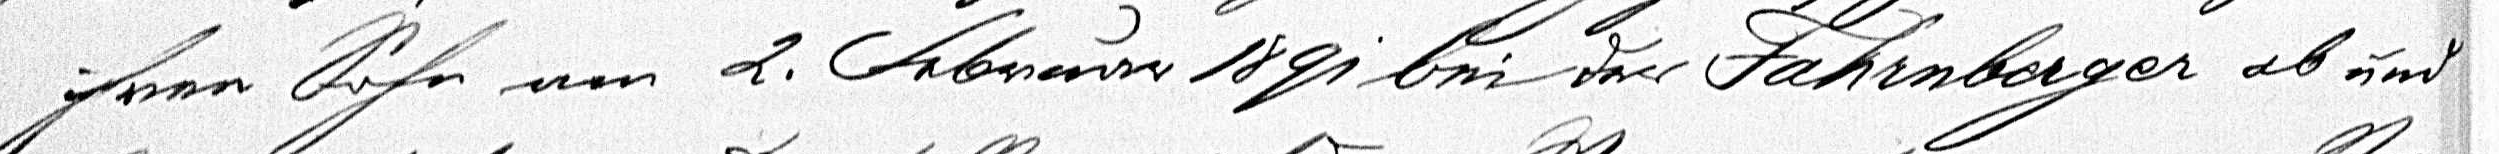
ihren Sohn am 2. Februar 1891 bei der Fahrnberger ab und
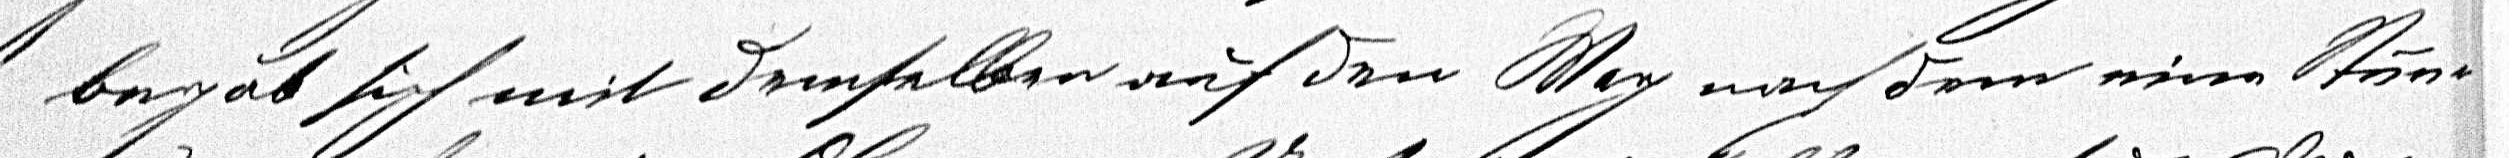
begab sich mit demselben auf den Weg nach dem eine Stun¬
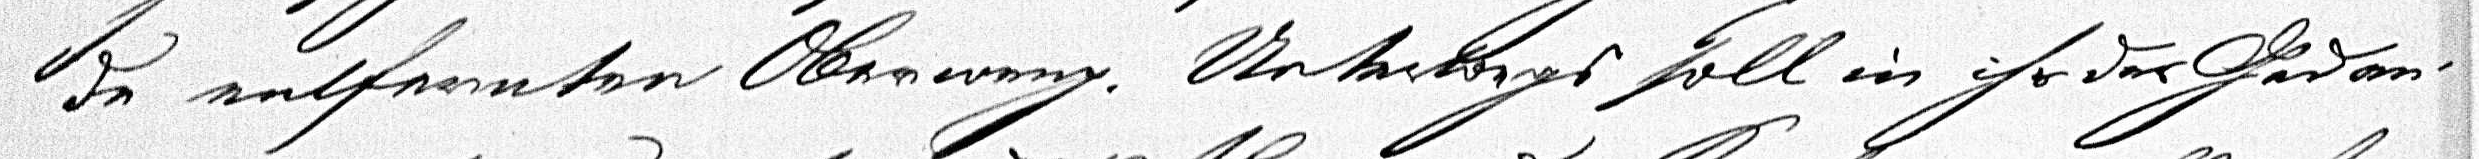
de entfernten Oberweng. Unterwegs soll in ihr der Gedan¬
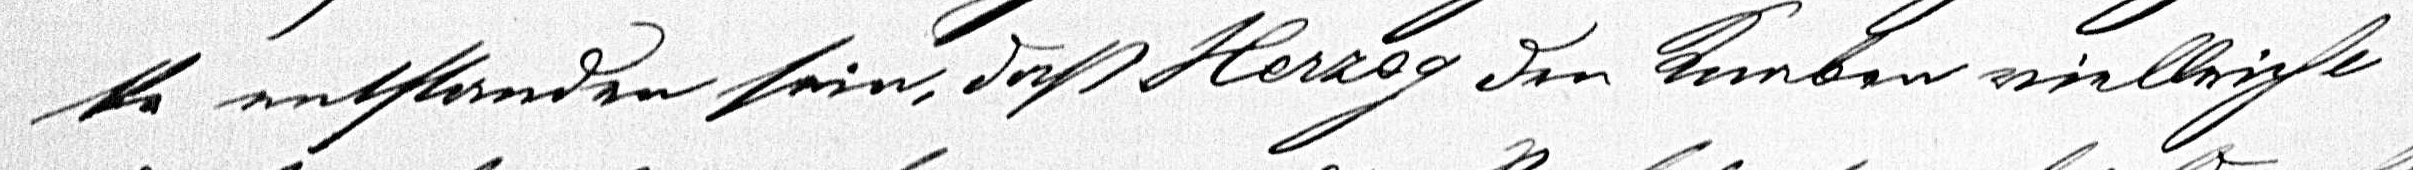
ke entstanden sein, daß Herzog den Knaben vielleicht
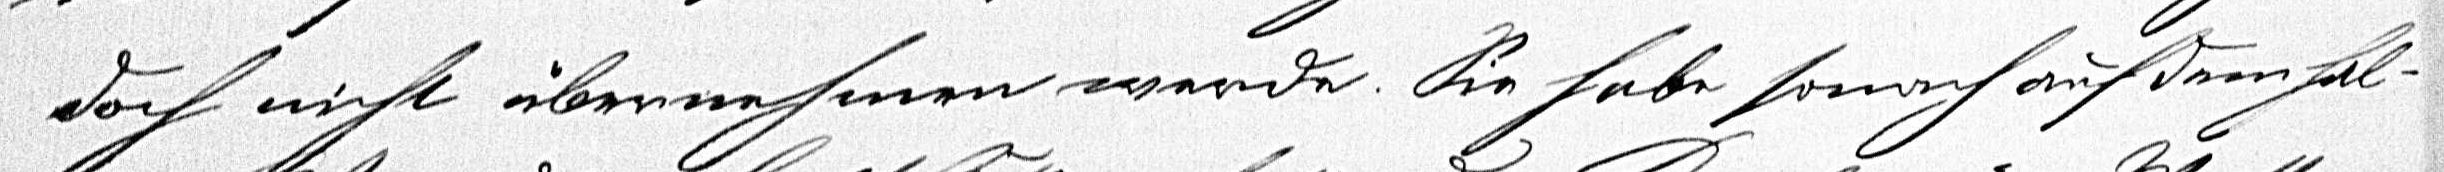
doch nicht übernehmen werde. Sie habe sonach auf dem hal¬
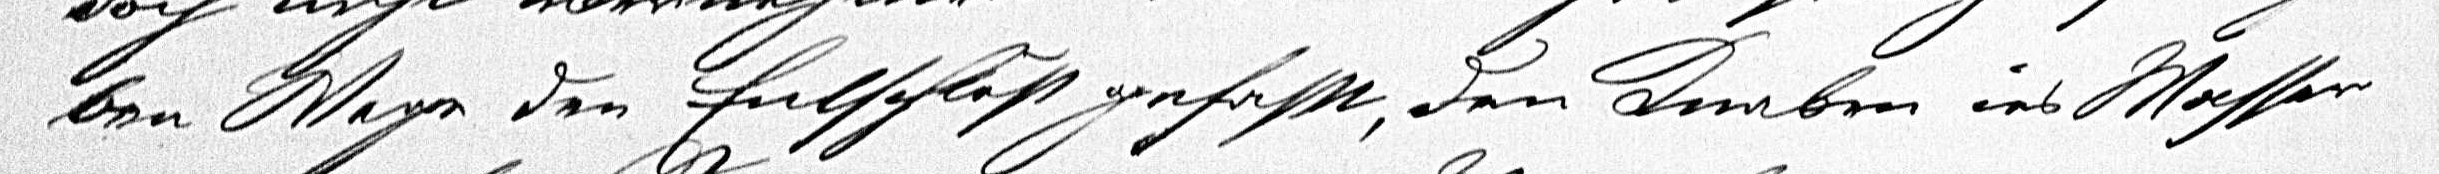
ben Wege den Entschluß gefaßt, den Knaben ins Wasser
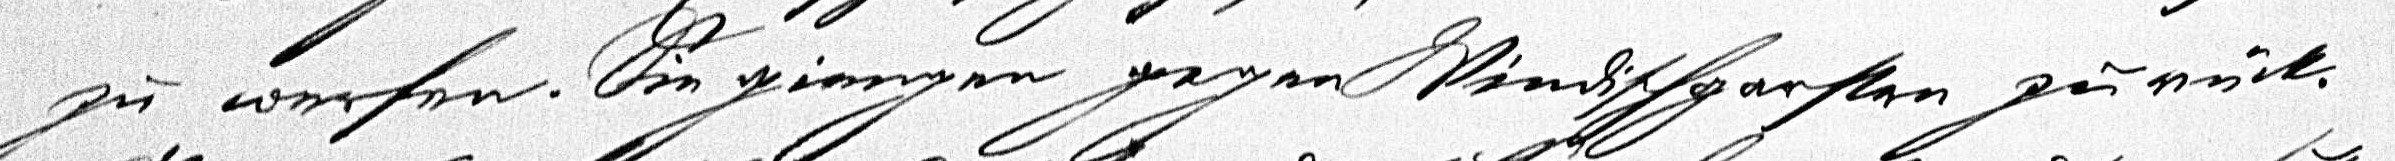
zu werfen. Sie giengen gegen Windischgarsten zurück.
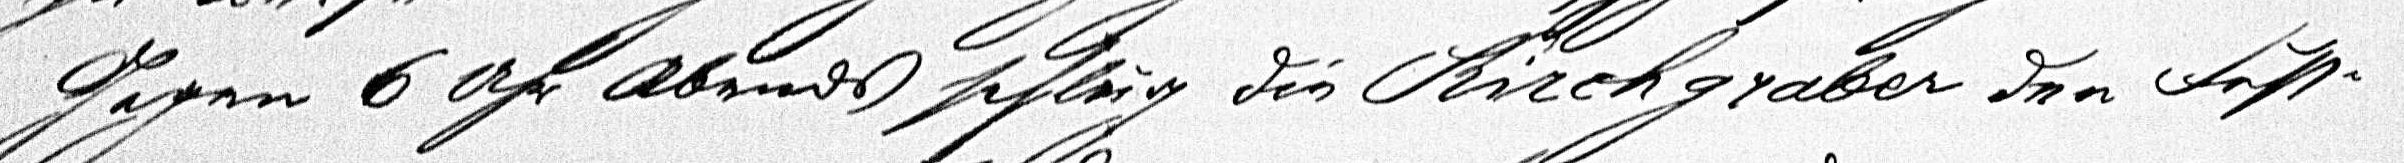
Gegen 6 Uhr Abends schlug die Kirchgraber den Fuß¬
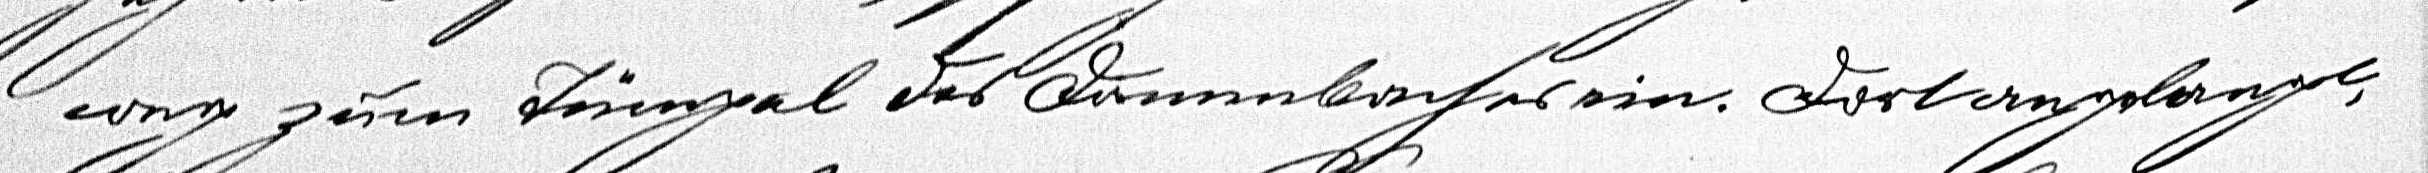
weg zum Tümpel des Dammbaches ein. Dort angelangt,
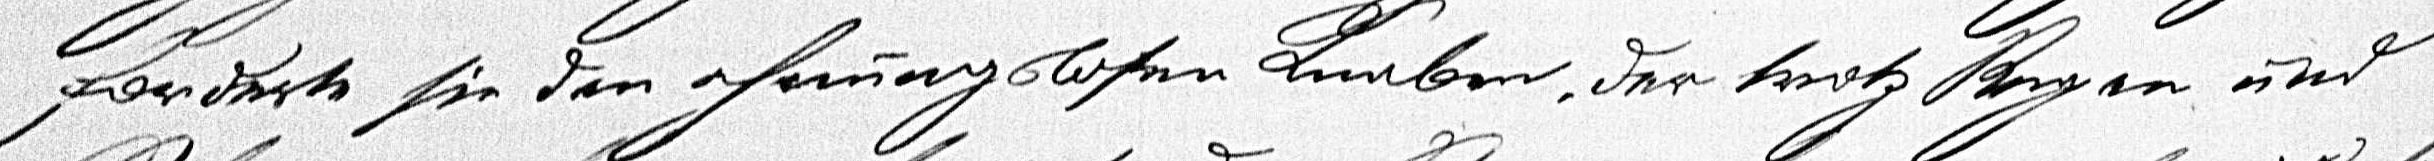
forderte sie den ahnungslosen Knaben, der trotz Regen und
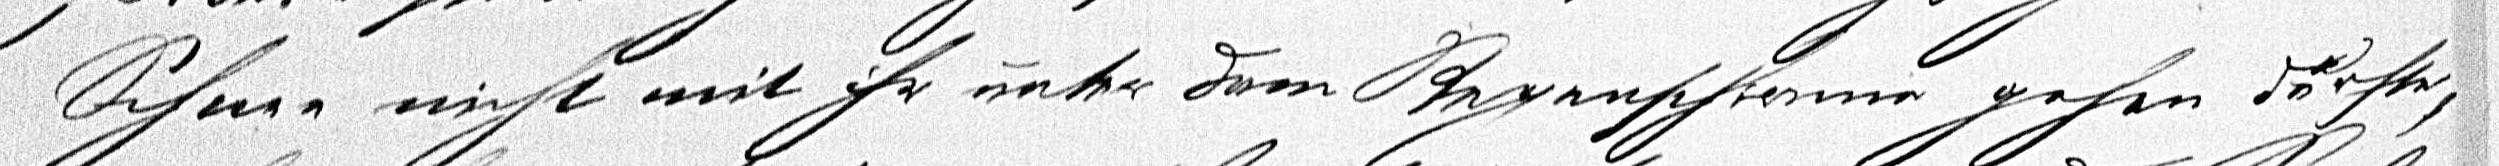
Schnee nicht mit ihr unter dem Regenschirm gehen dürfte,
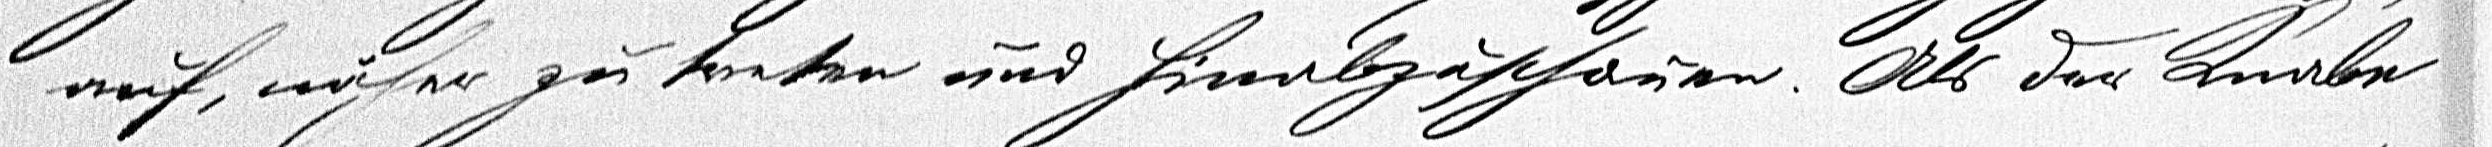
auf, näher zu treten und Hinabzuschauen. Als der Knabe
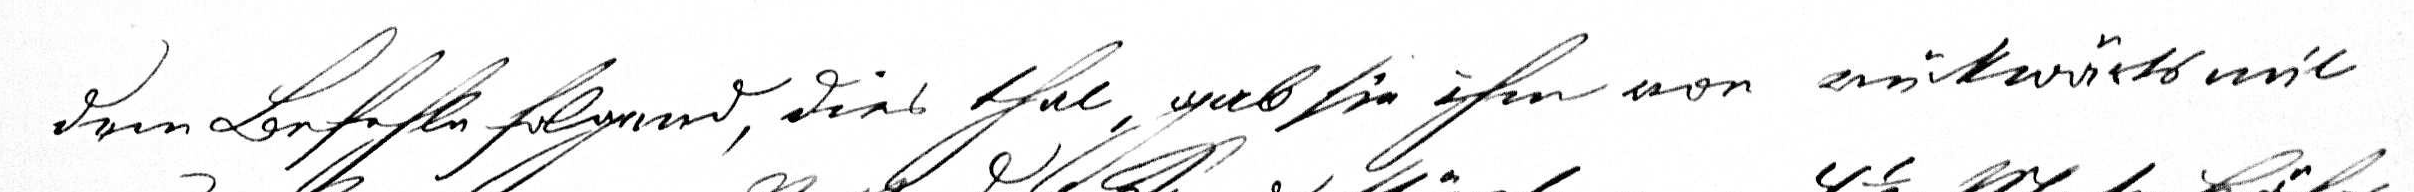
dem Befehle folgend, dies that, gab sie ihm von rückwärts mit
